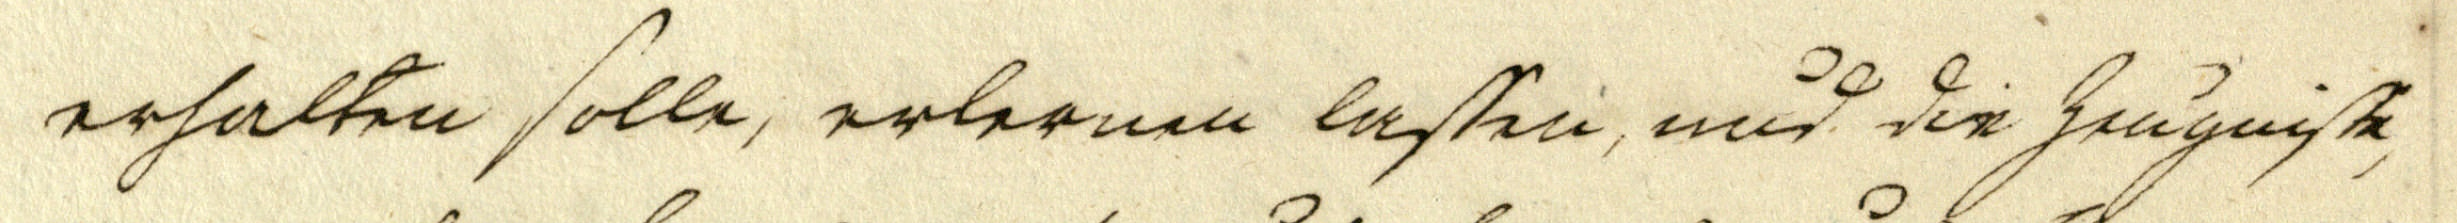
erhalten solle, erlernen lassen, und die Zeugnisse
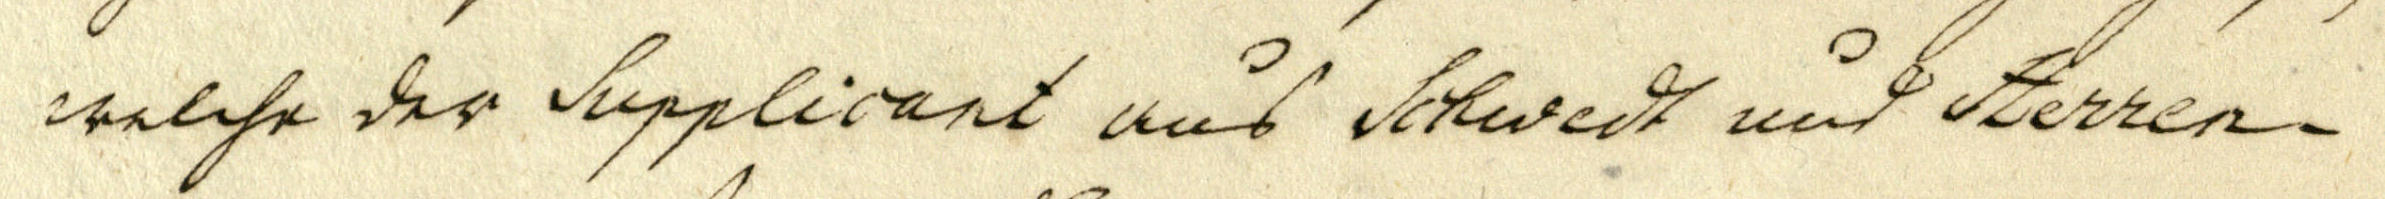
welche der Supplicant aus Schwedt und Herren¬
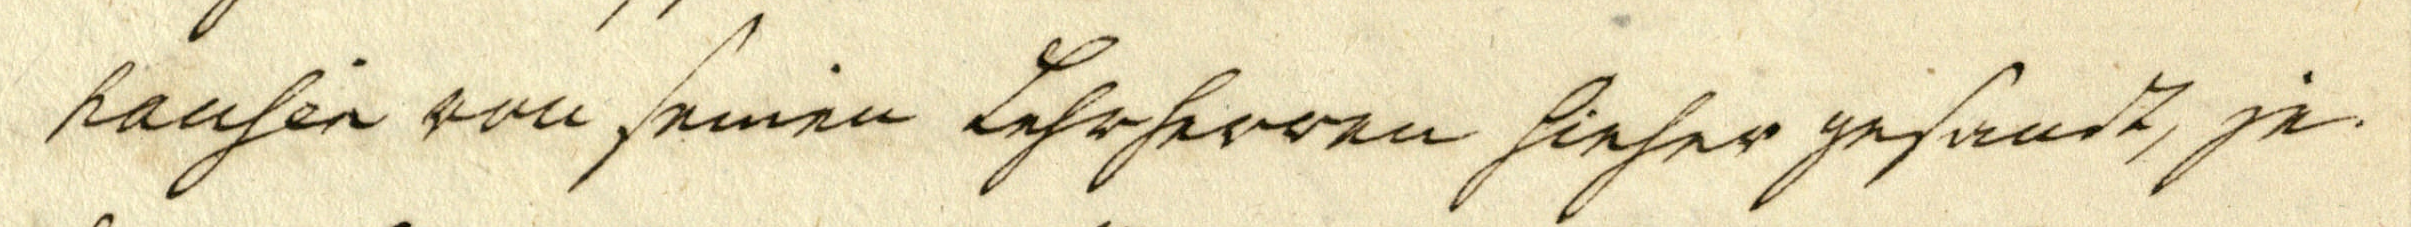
hausen von seinen Lehrherren hieher gesandt, je¬
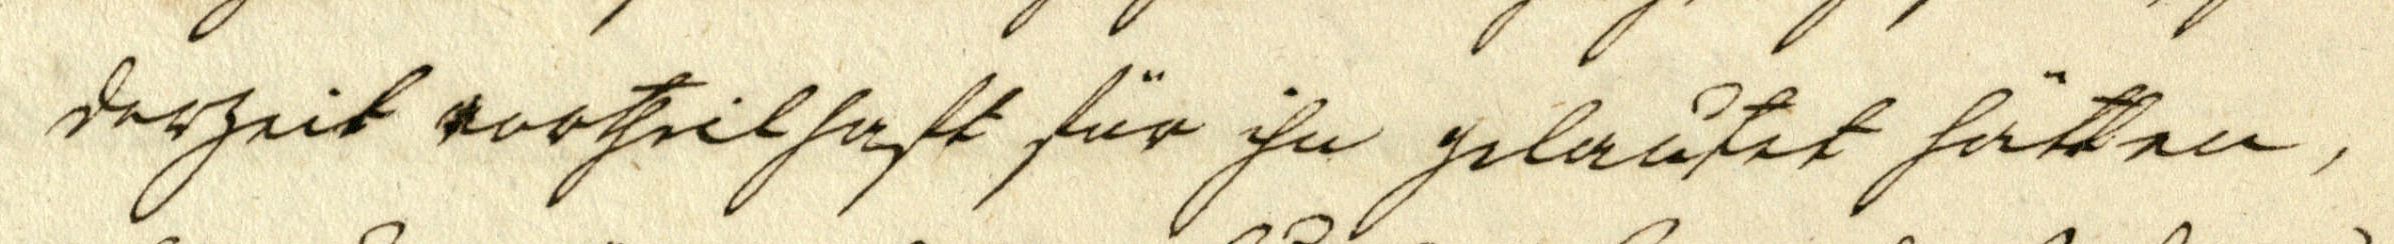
derzeit vortheilhaft für ihn gelautet hätten,
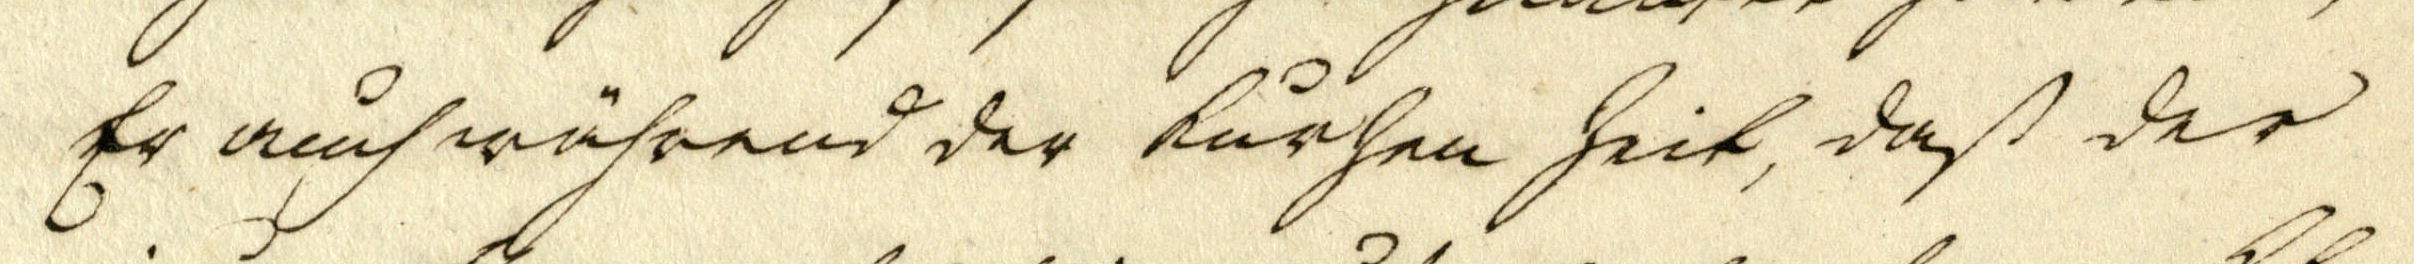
Er auch während der kurzen Zeit, daß der
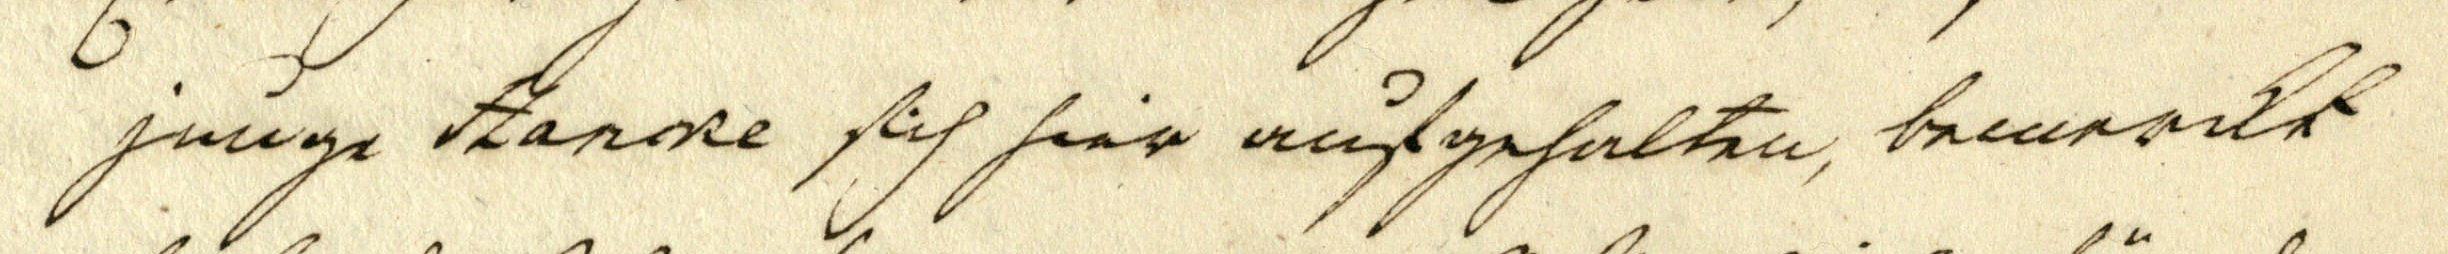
junge Hancke sich hier aufgehalten, bemerckt
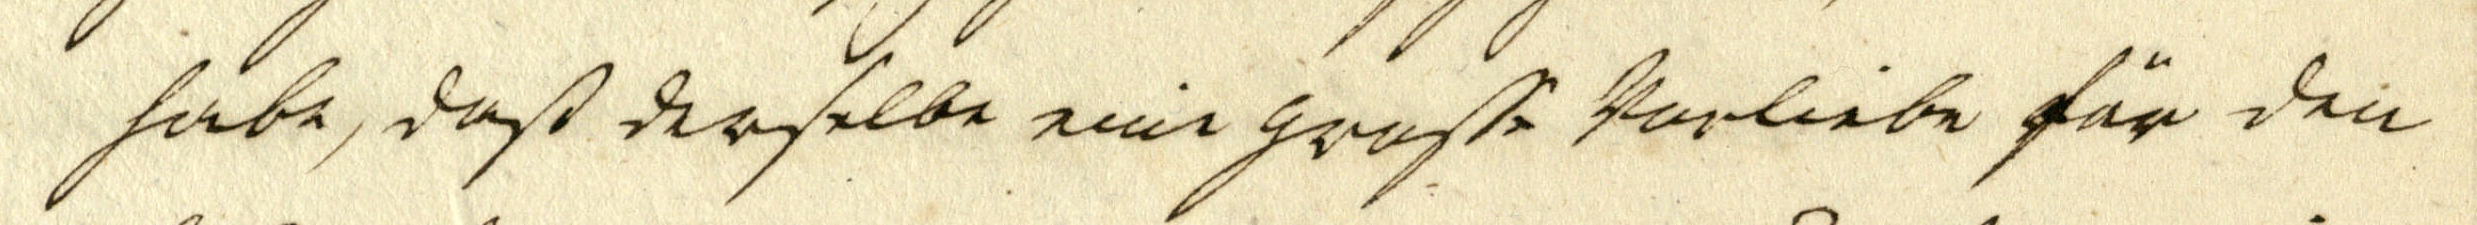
habe, daß derselbe eine grosse Vorliebefür den
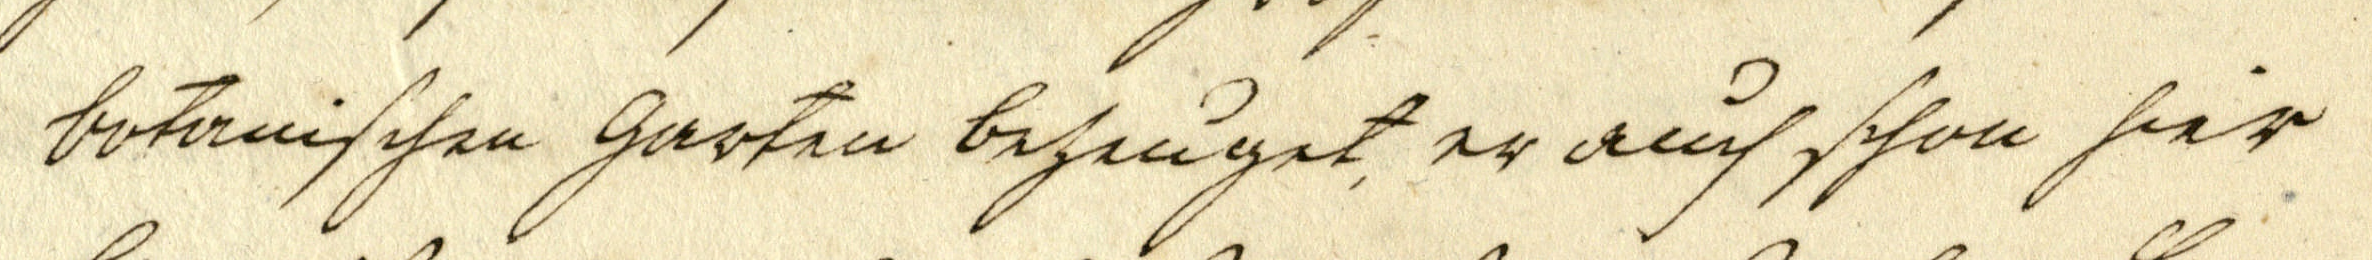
botanischen Garten bezeuget, er auch schon hier
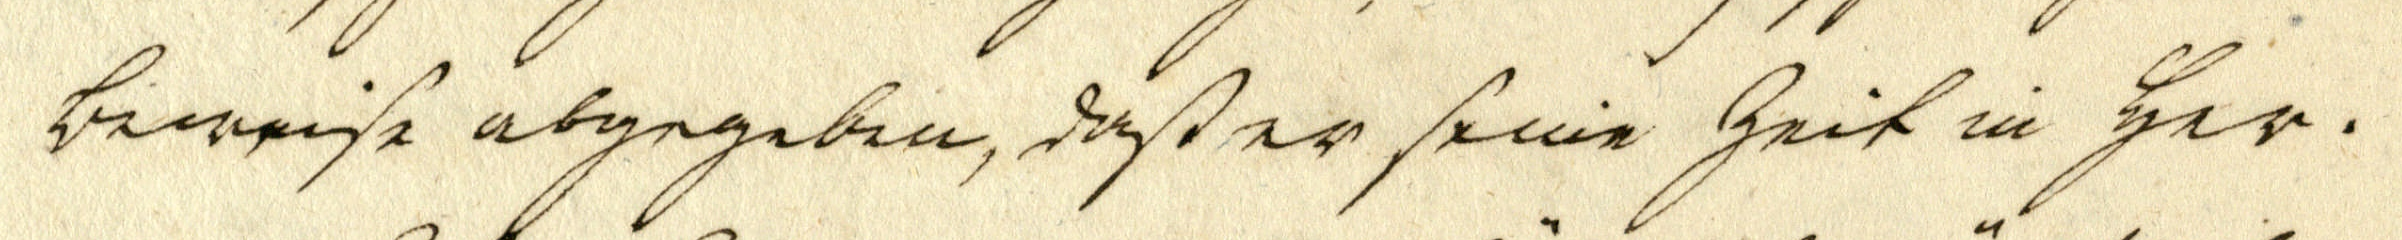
Beweise abgegeben, daß er seine Zeit in Her¬
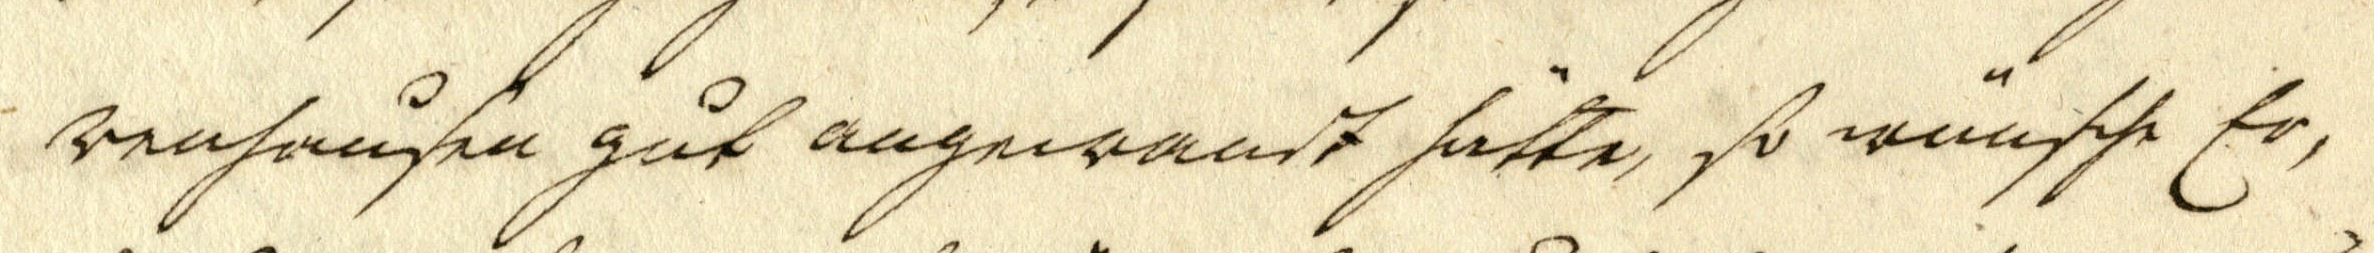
renhausen gut angewandt hätte, so wünsche Er,
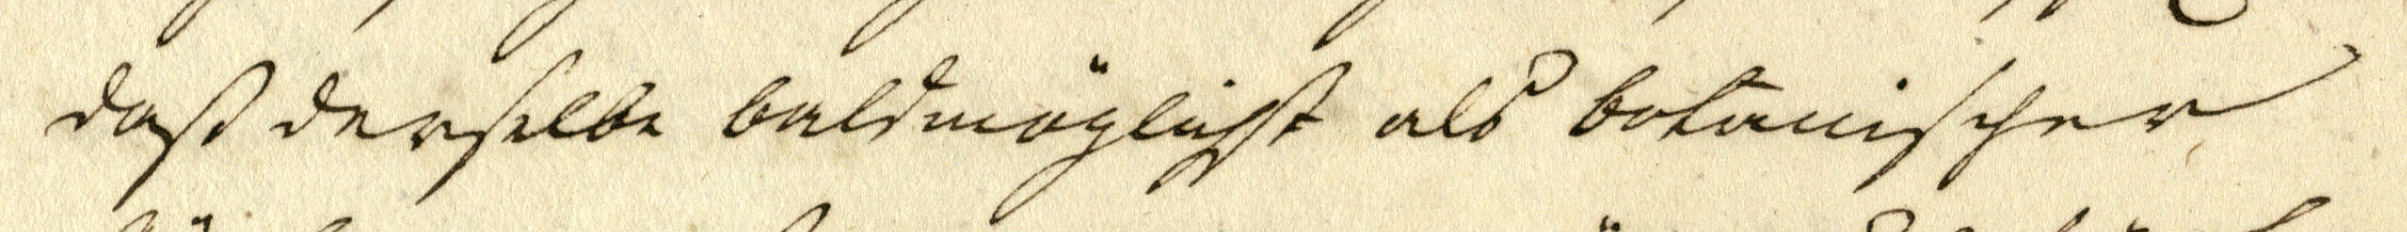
daß derselbe baldmöglichst als botanischer
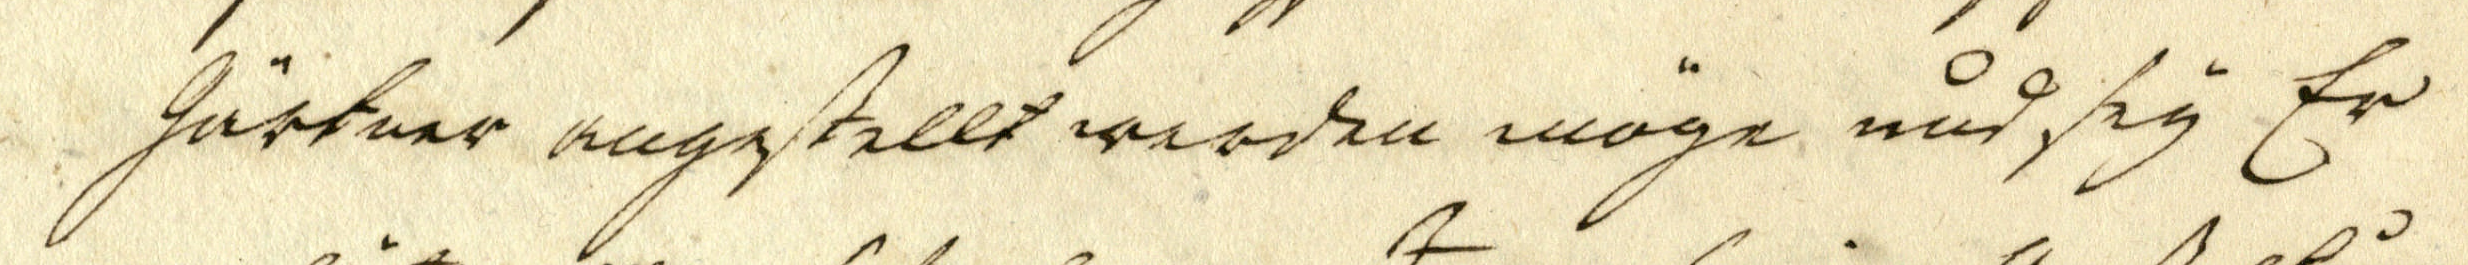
Gärtner angestellt werden möge und seÿ Er
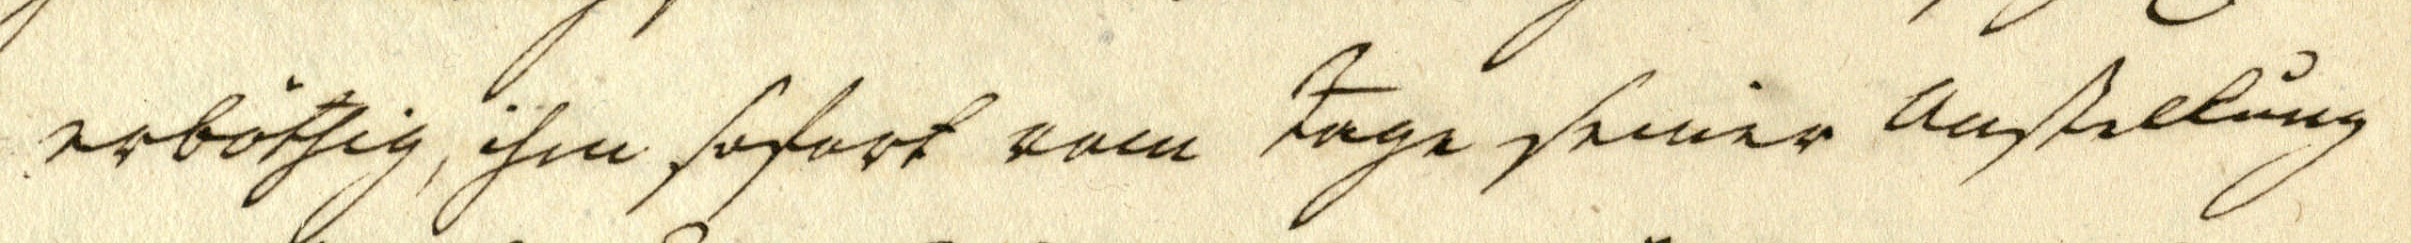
erböthig, ihm sofort vom Tage seiner Anstellung
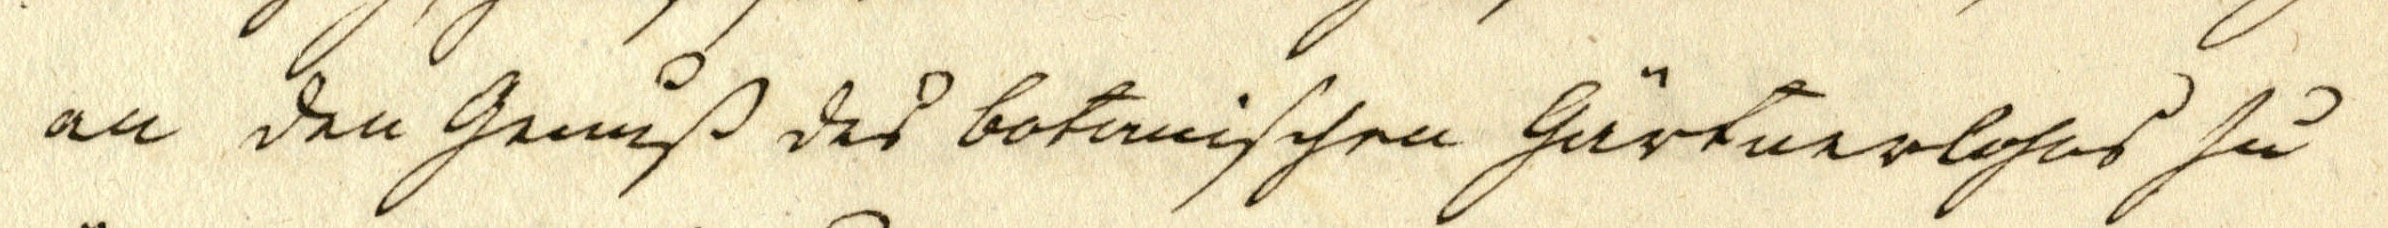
an den Genuß des botanischen Gärtnerlohns zu
